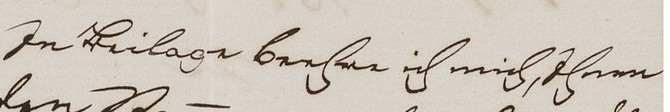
In Beilage beehre ich mich, Ihnen
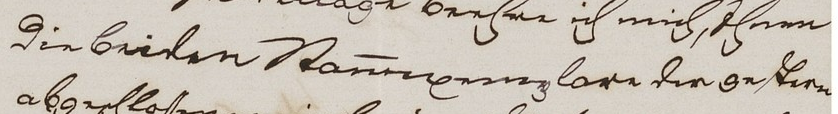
die beiden Stammexemplare der gestern
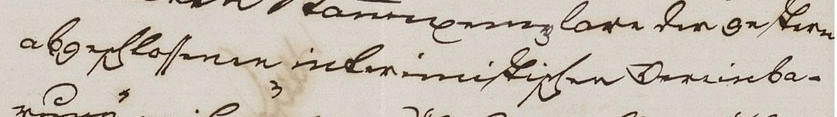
abgeschlossenen «interimistischen Vereinba-
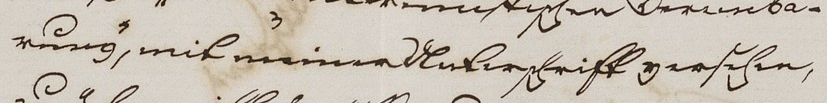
rung», mit meiner Unterschrift versehen,
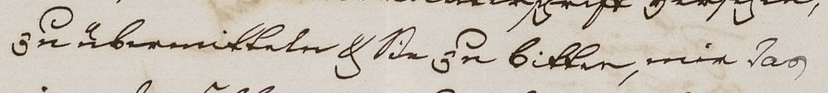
zu übermitteln & Sie zu bitten, mir das
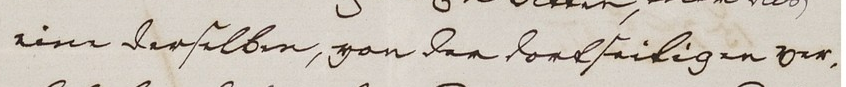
eine derselben, von der dortseitigen ver-
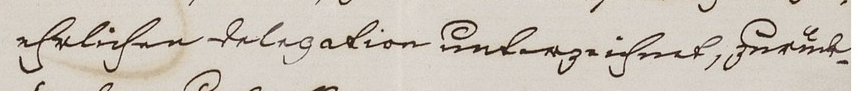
ehrlichen Delegation unterzeichnet, zurück-
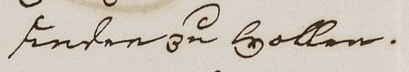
senden zu wollen.
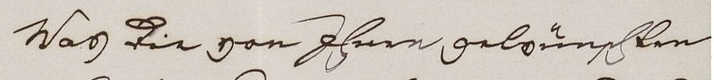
Was die von Ihnen gewünschten
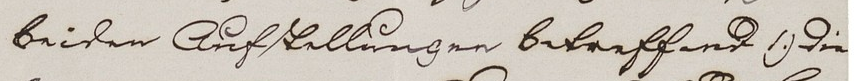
beiden Aufstellungen betreffend 1.) die
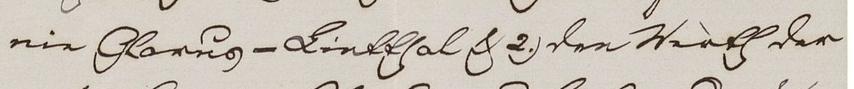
nie Glarus–Lintthal & 2.) den Werth der
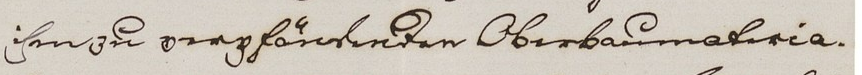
ihm zu verpfändenden Oberbaumateria-
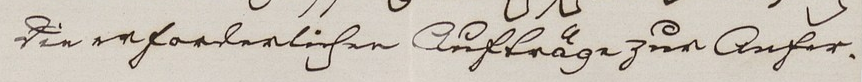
die erforderlichen Aufträge zur Anfer-
